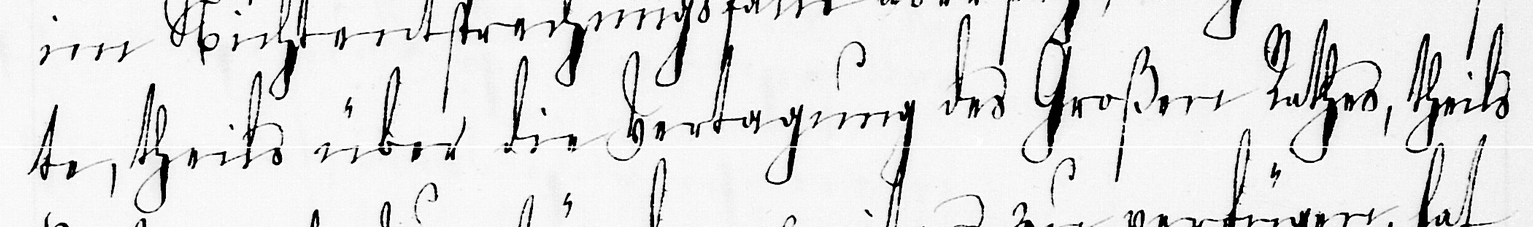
te, theils über die Vertagung des Großen Rathes, theils
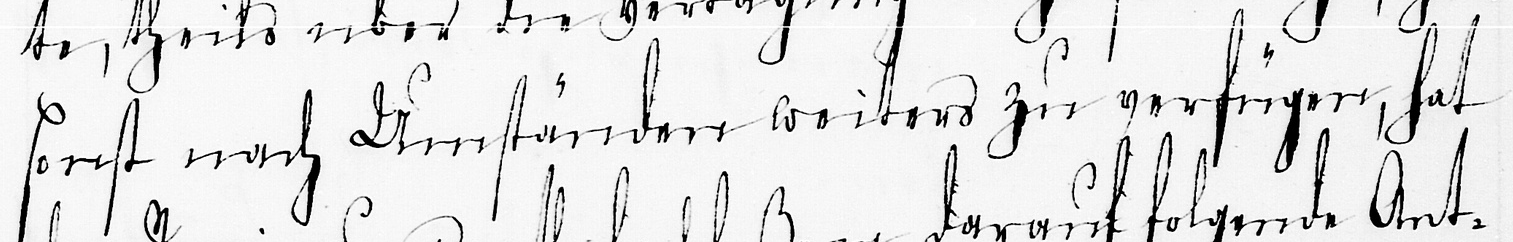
sonst nach Umständen weiters zu verfügen, hat
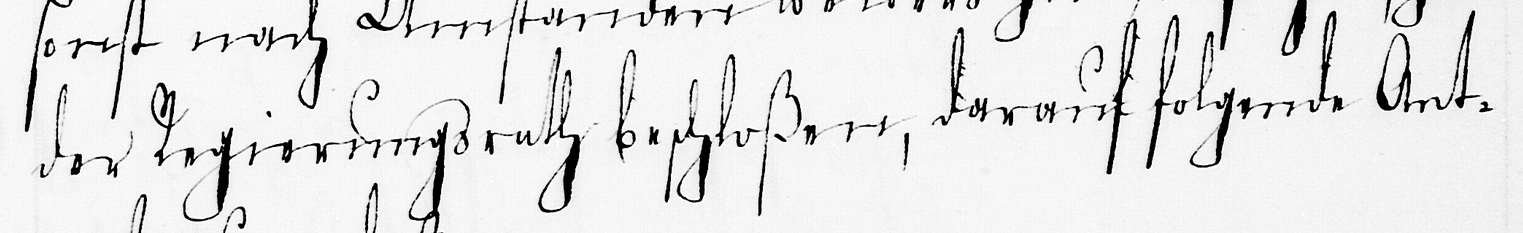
der Regierungsrath beschloßen, darauf folgende Ant¬
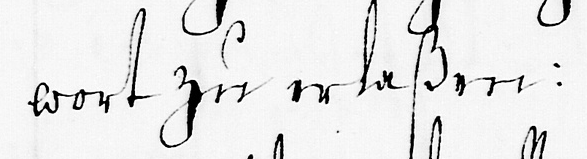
wort zu erlaßen:
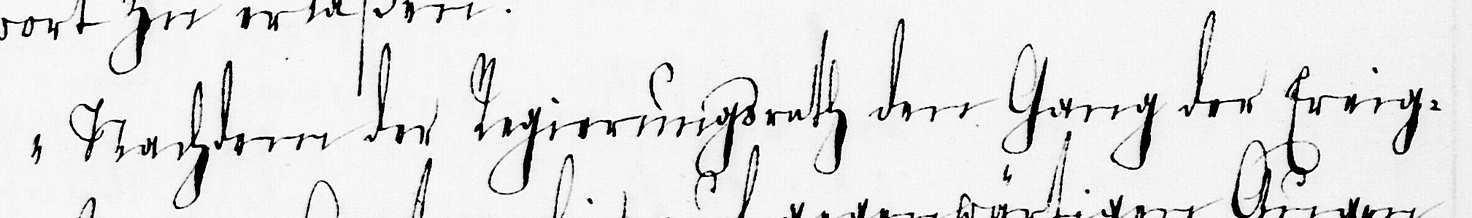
„Nachdem der Regierungsrath den Gang der Ereig¬
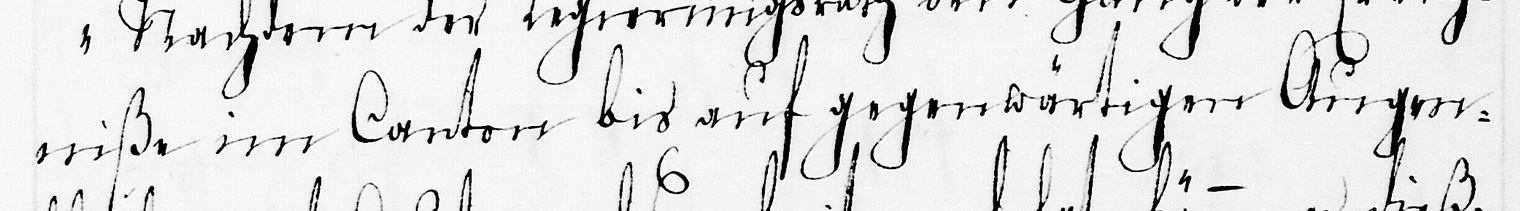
niße im Canton bis auf gegenwärtigen Augen¬
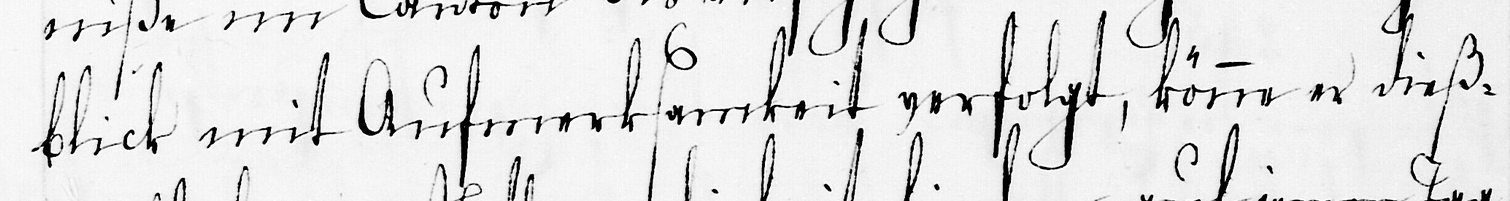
blick mit Aufmerksamkeit verfolgt, könne er dieß¬
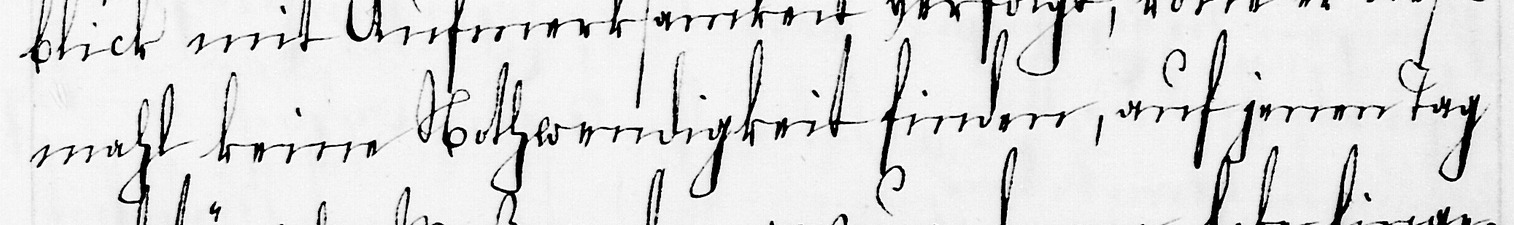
mahl keine Nothwendigkeit finden, auf jenen Tag
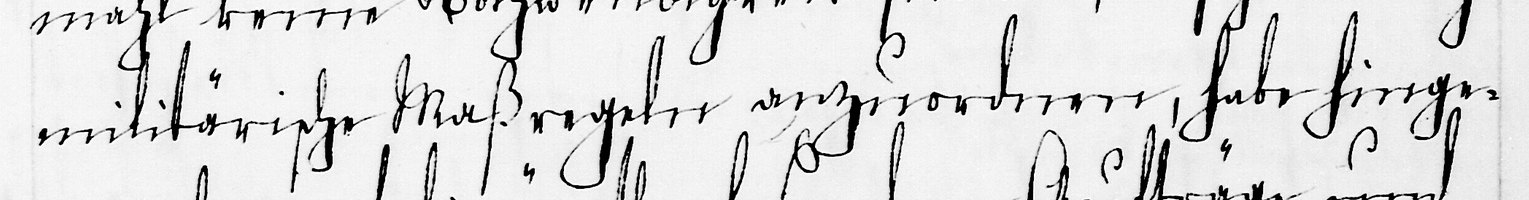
militärische Maßregeln anzuordnen, habe hinge¬
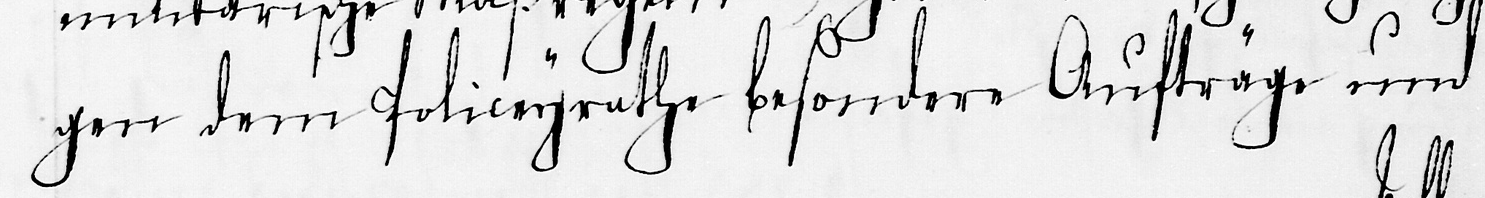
gen dem Policeyrathe besondere Aufträge und
